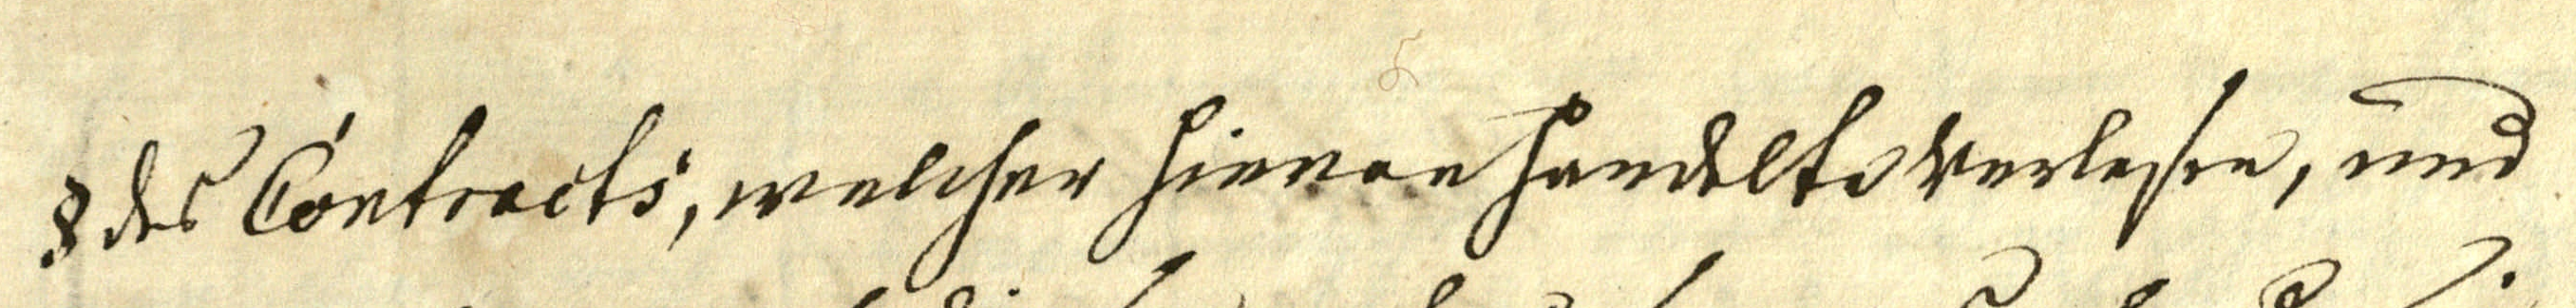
§ des Contracts, welcher hievon handelte verlesen, und
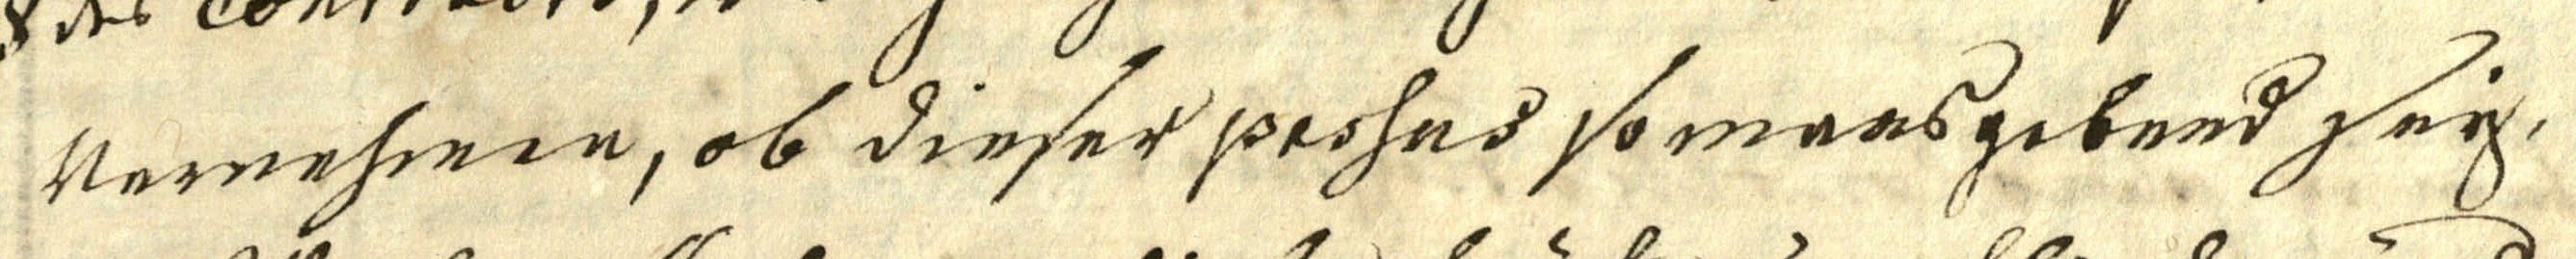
vernehmen, ob dieser passus so maasgebend seÿ,
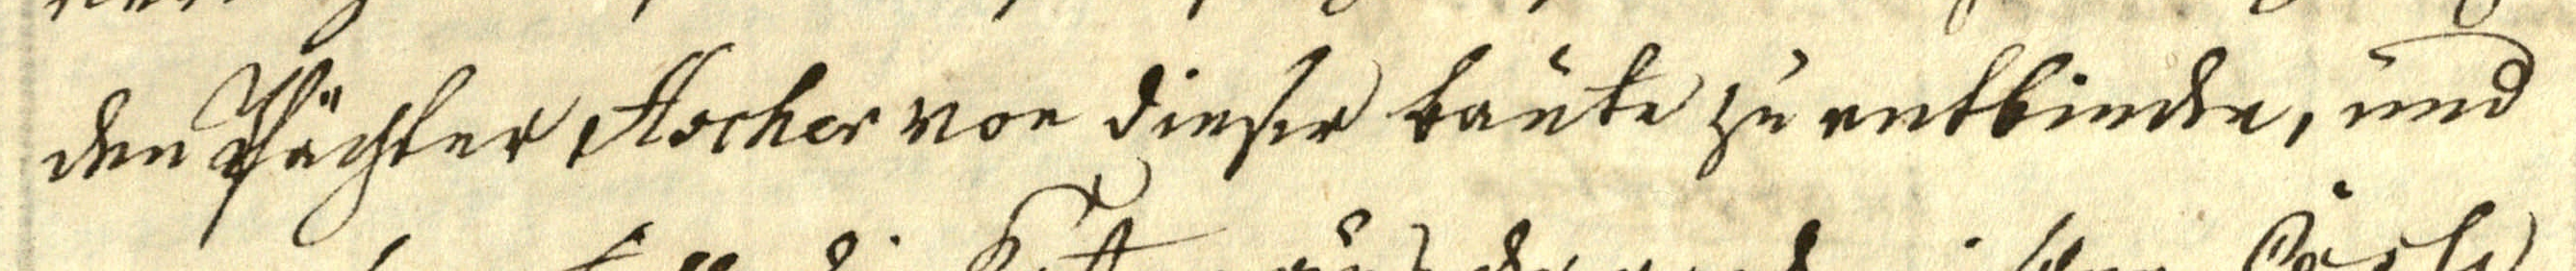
den Pächter Ascher von dieser Baute zu entbinden, und
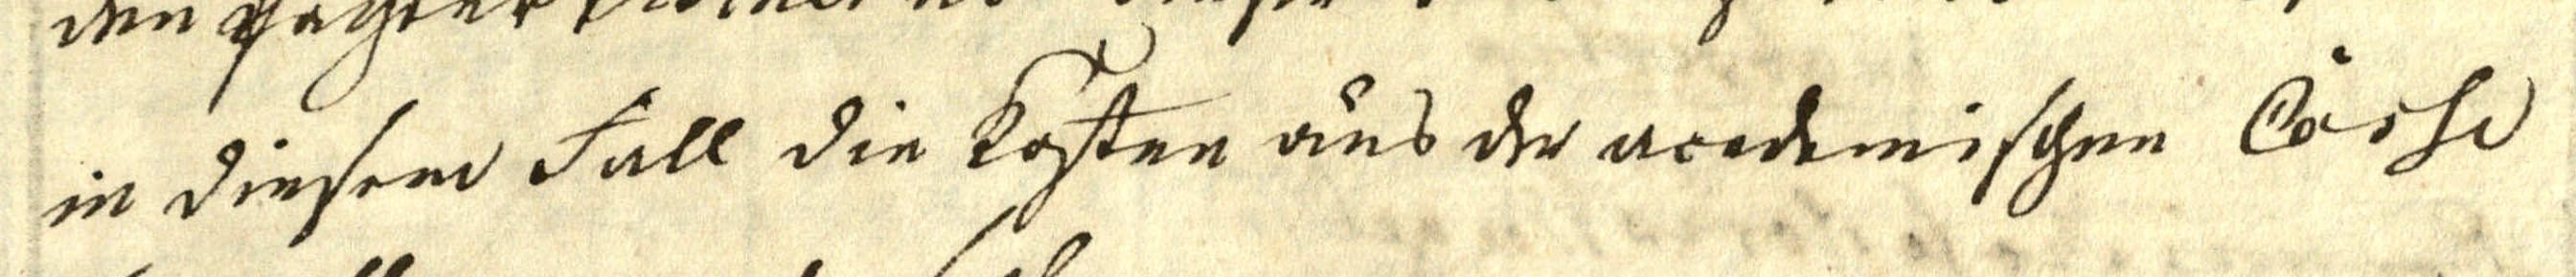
in diesem Fall die Kosten aus der academischen Casse
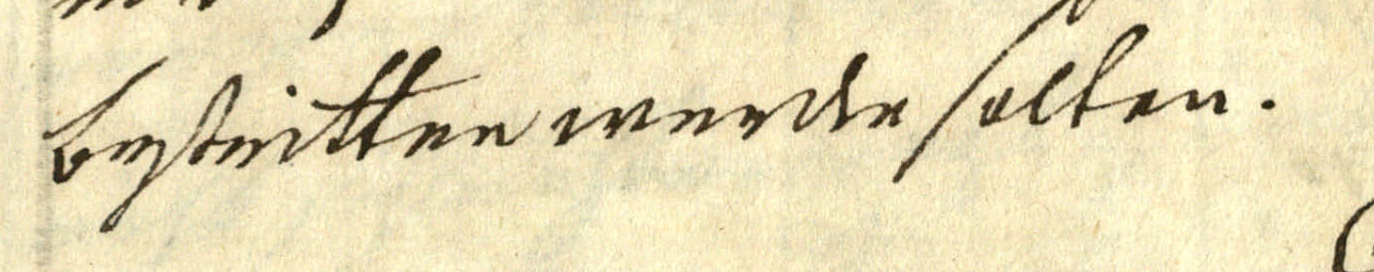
bestritten werden solten.
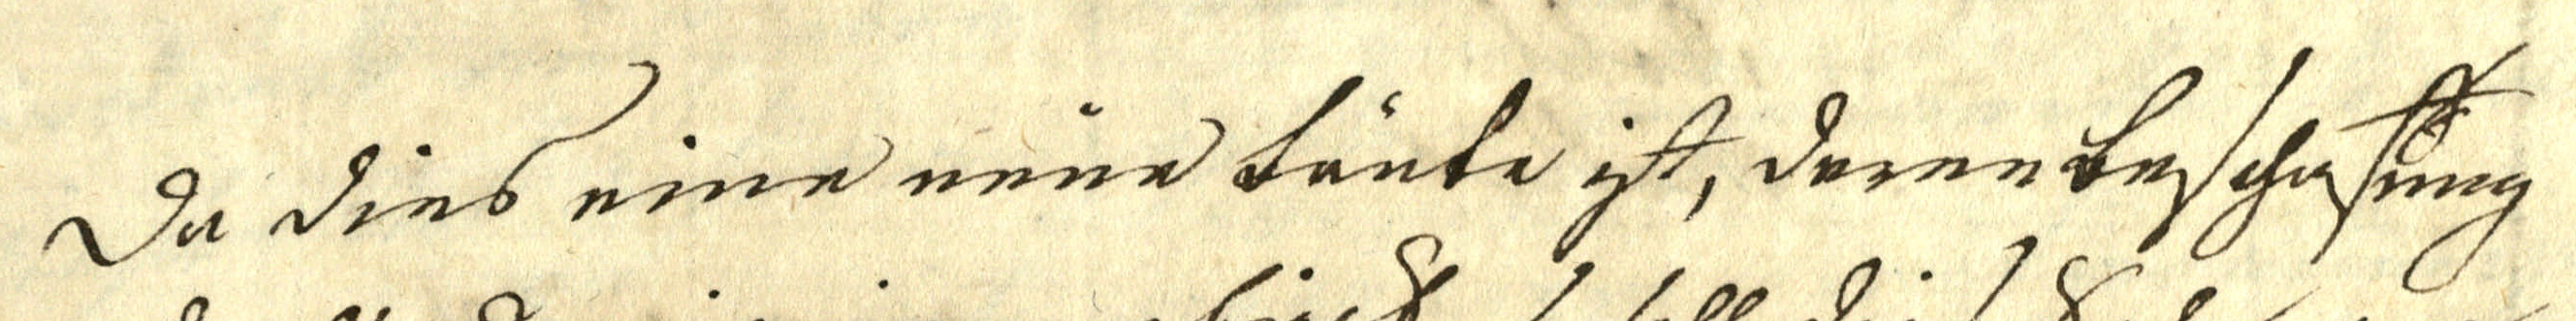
Da dies eine neue Baute ist, deren Beschaffung
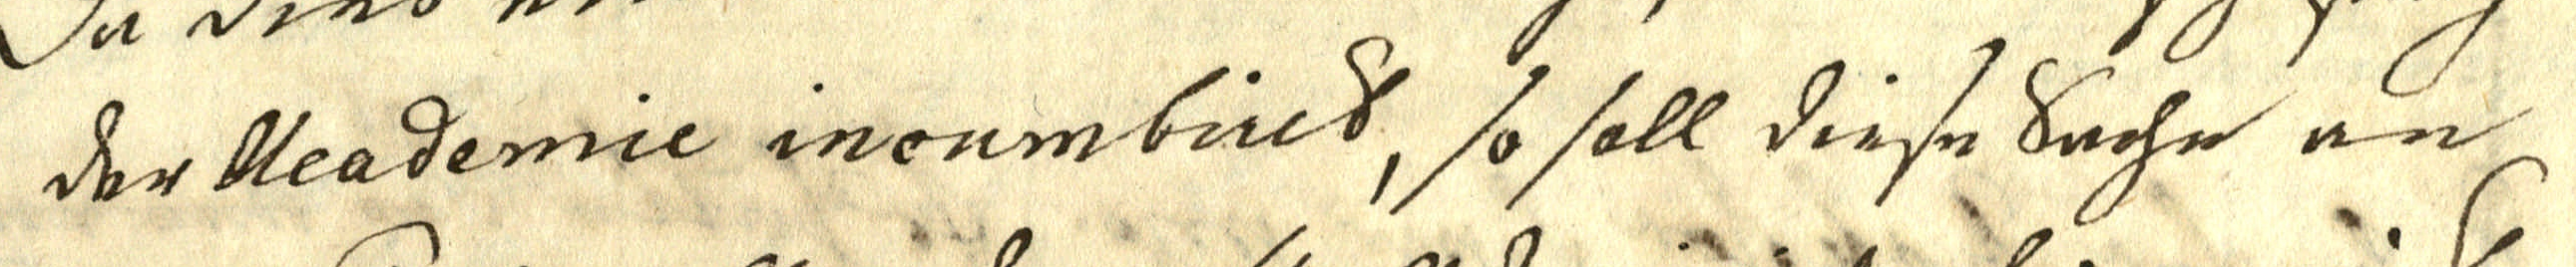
der Academie incumbiret, so soll diese Sache an
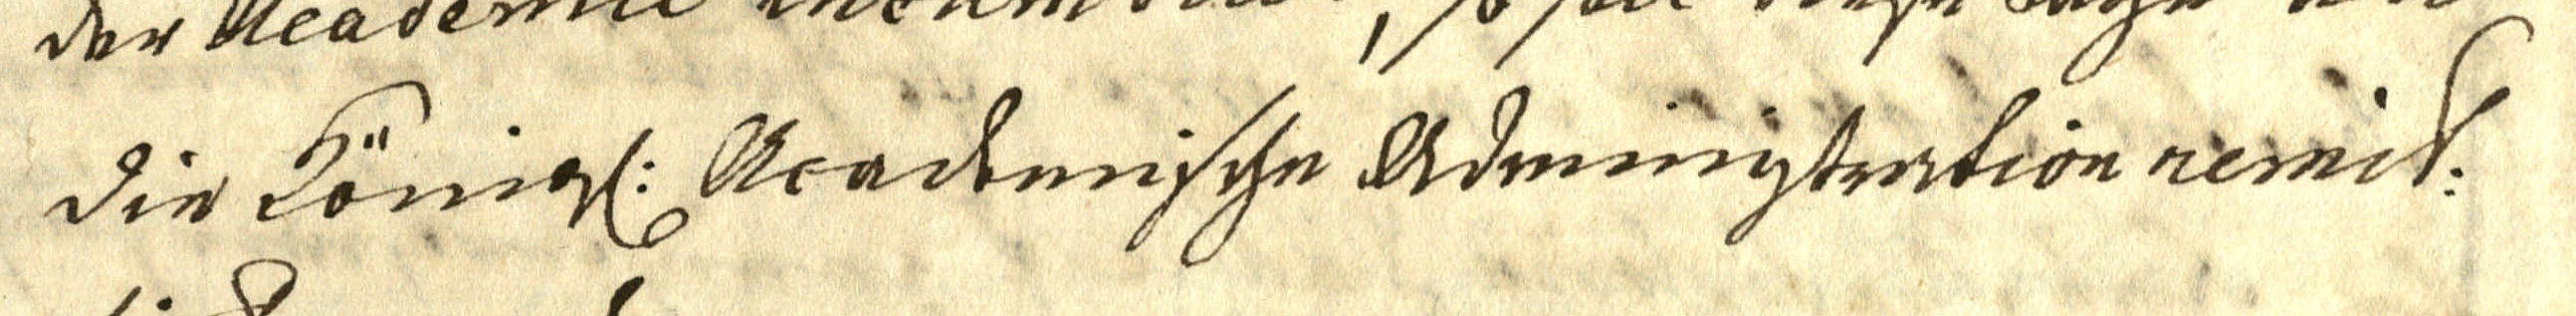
die Königl. Academische Administration remit¬
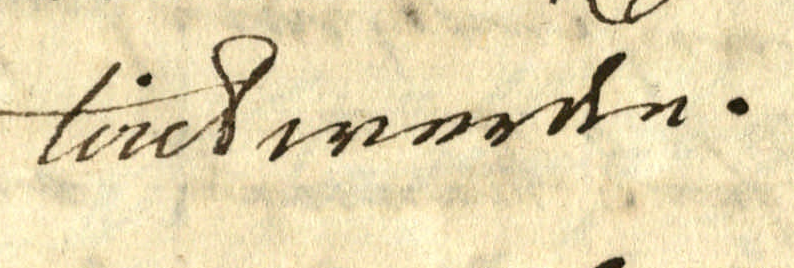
tiret werden.
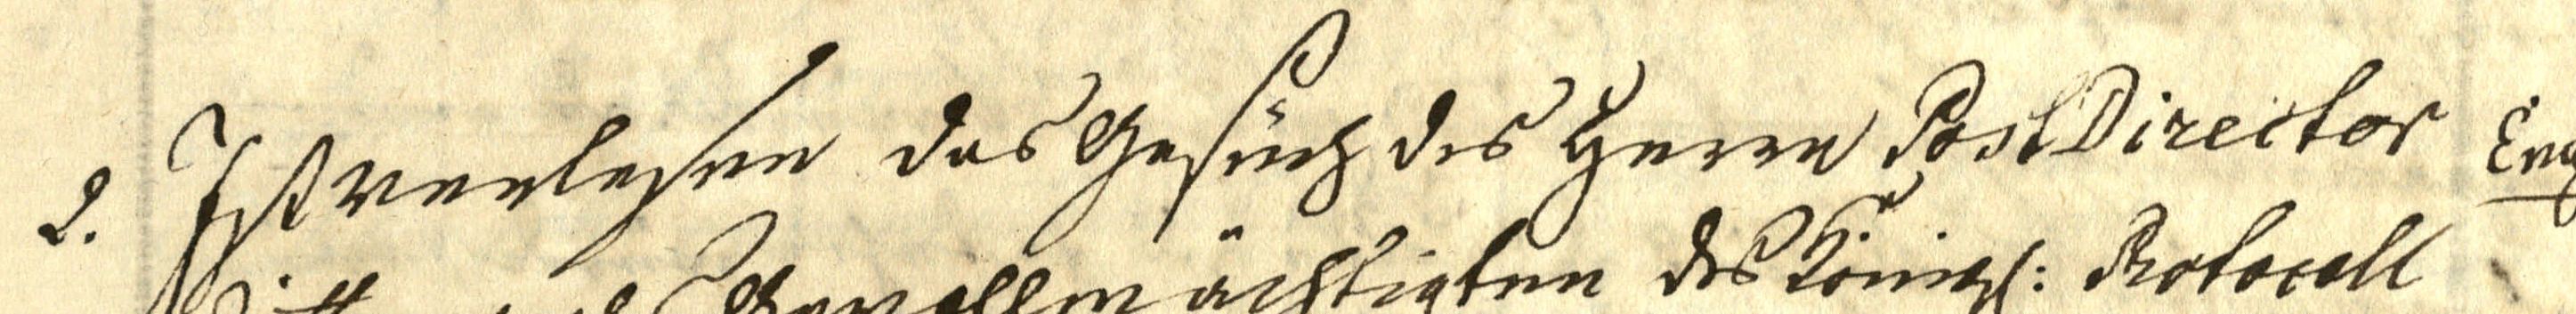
2. Ist verlesen das Gesuch des Herrn PostDirector
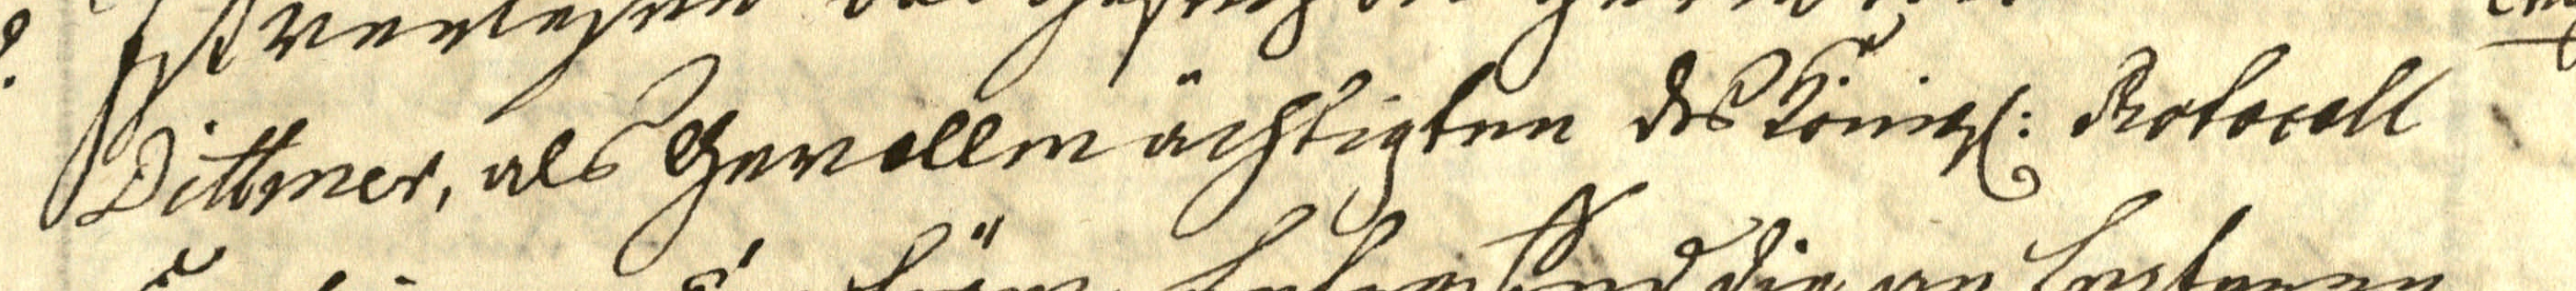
Dittmer, als Gevollmächtigten des Königl. Protocoll
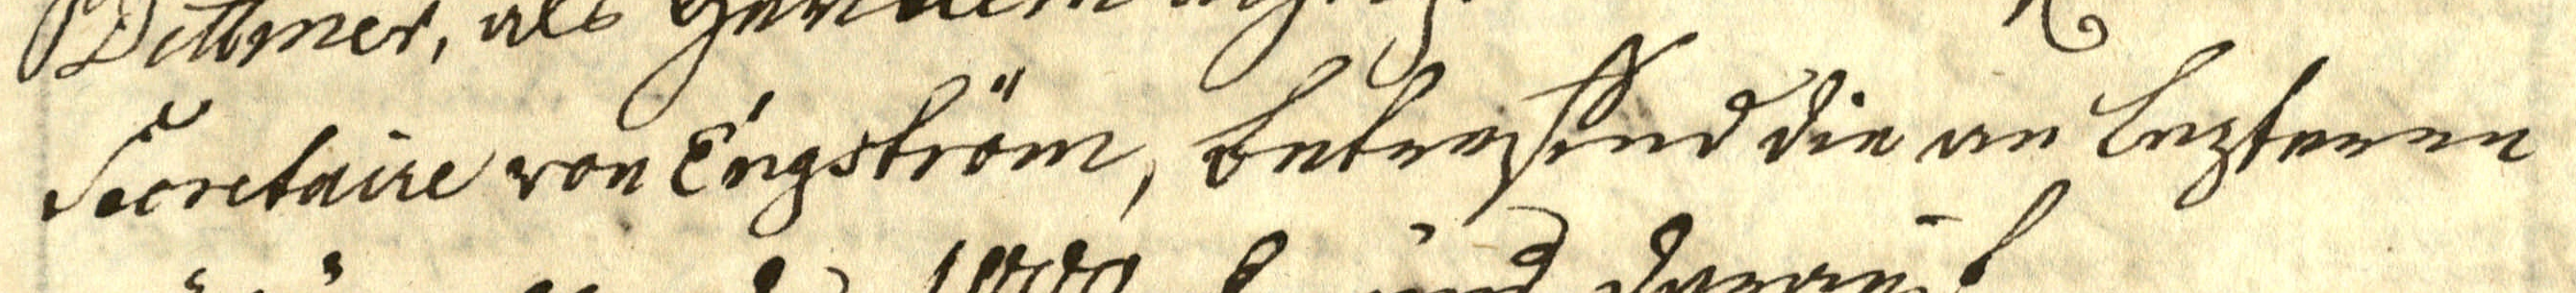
Secretaire von Engström, betreffend die an lezteren
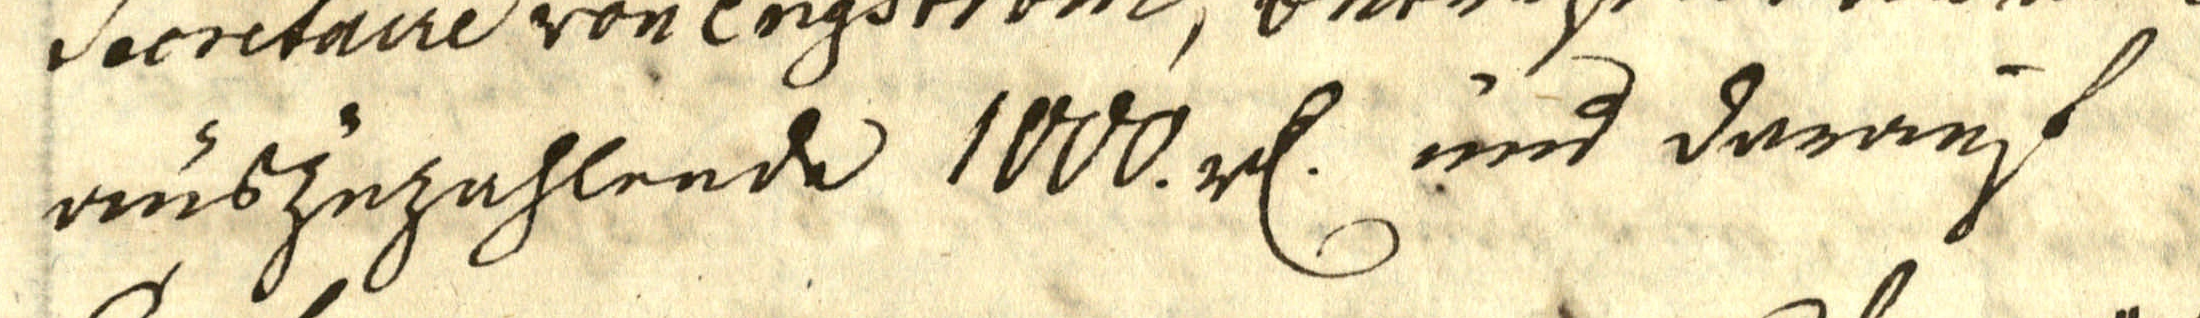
auszuzahlende 1000. rt. und darauf
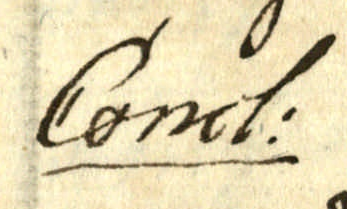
Concl.
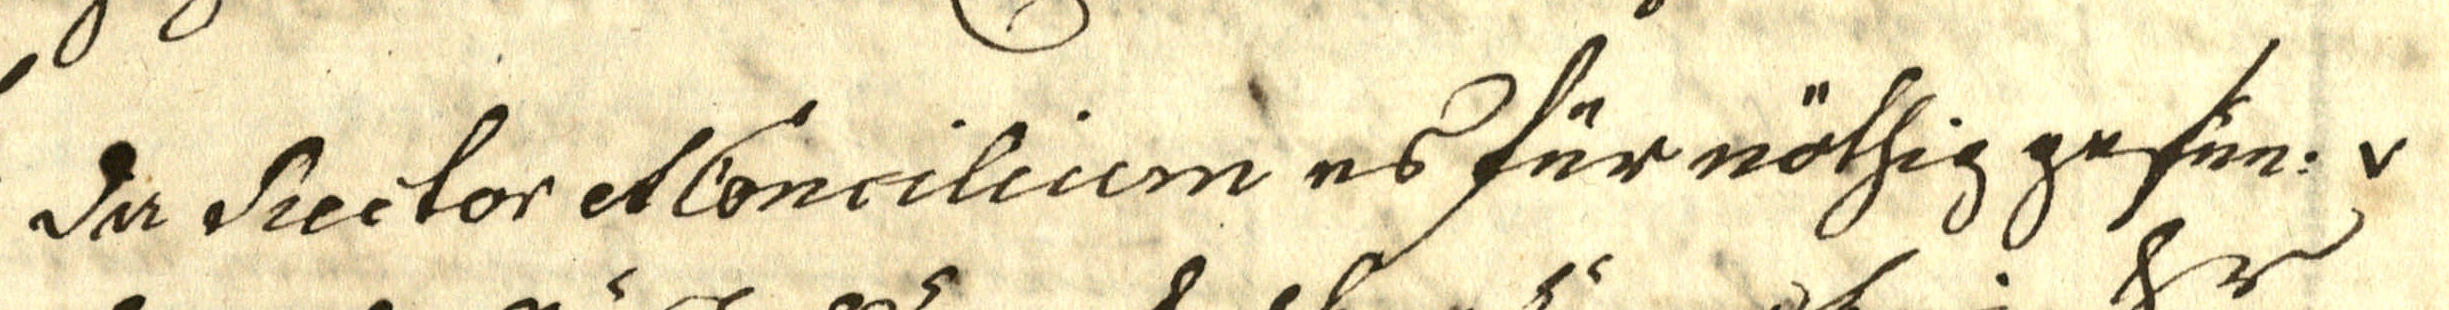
Da Rector et Concilium es für nöthig gefun¬
